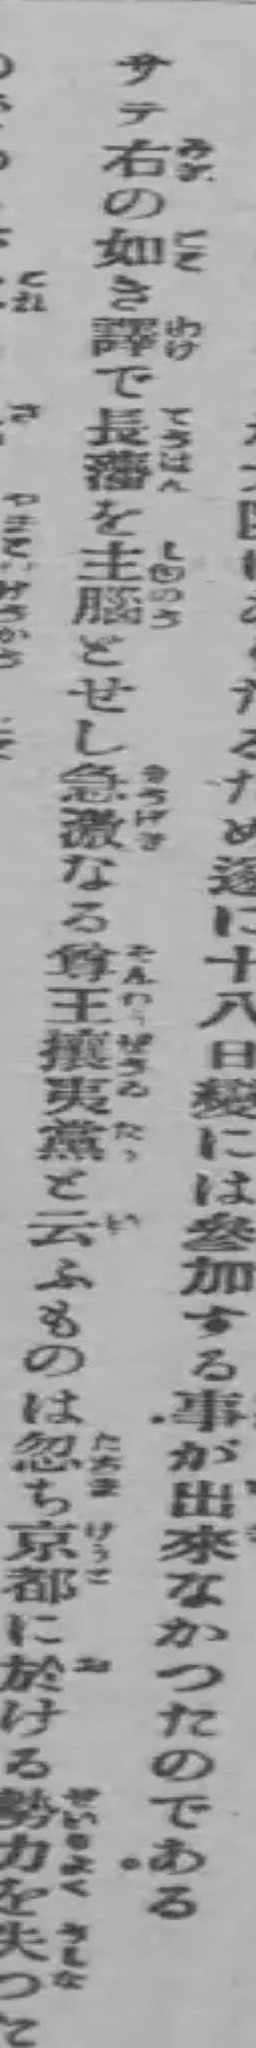サテ右の如き訳で長藩を首脳とせし急激なる尊王攘夷党と云ふものは忽ち京都に於ける勢力を失つた
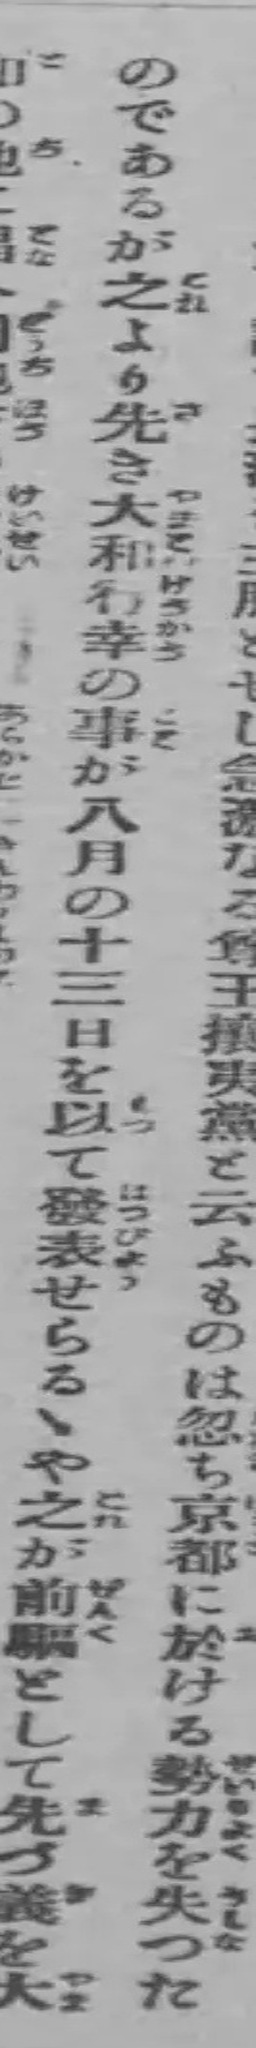のであるが之より先き大和行幸の事が八月の十三日を以て発表せらるゝや之が前駆として先づ義を大
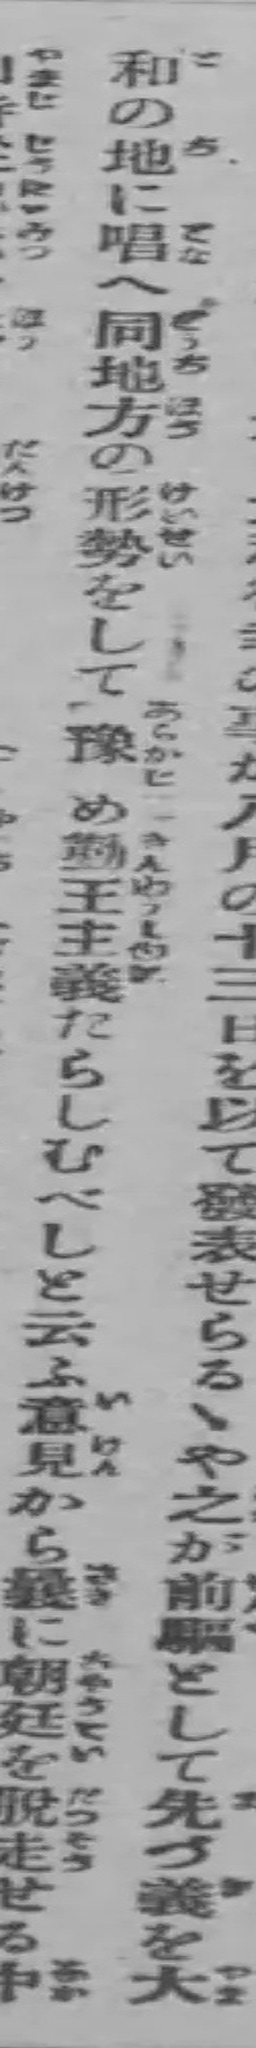和の地に唱へ同地方の形勢をして豫め勤王主義たらしむべしと云ふ意見から曩に朝廷を脱走せる中
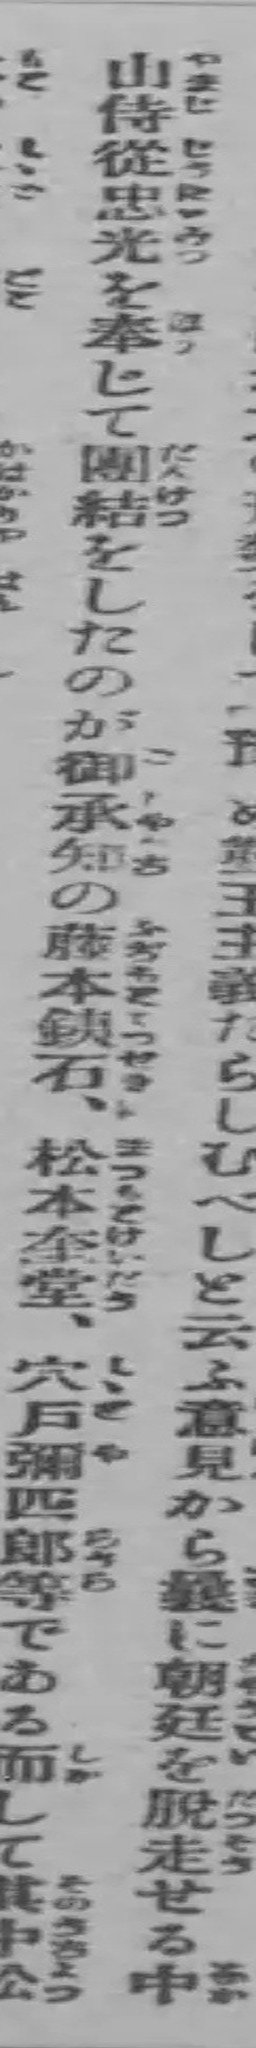山侍従忠光を奉じて団結をしたのが御承知の藤本鉄石、松本奎堂、宍戸弥四郎等である而して其中松
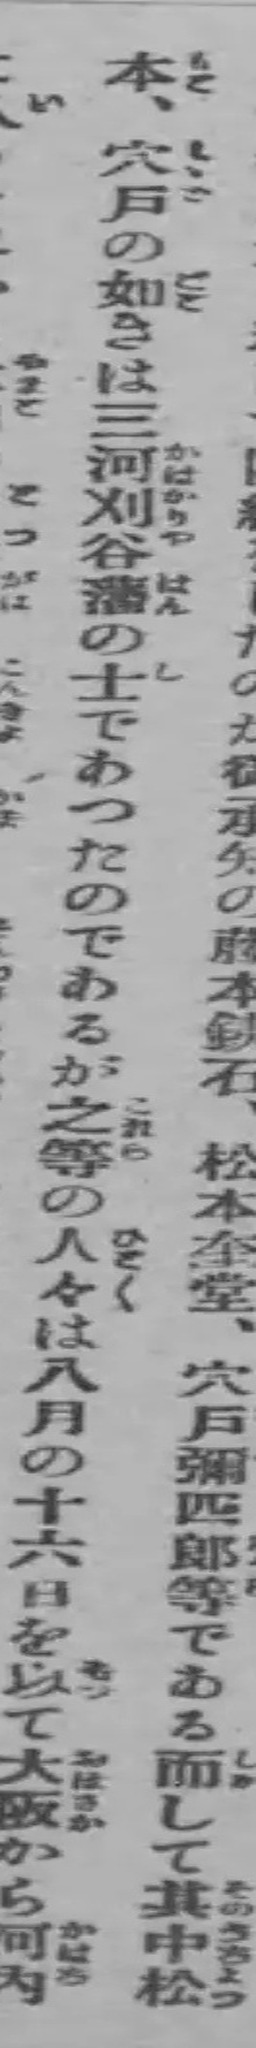本、宍戸の如きは三河刈谷藩の士であつたのであるが之等の人々は八月の十六日を以て大阪から河内
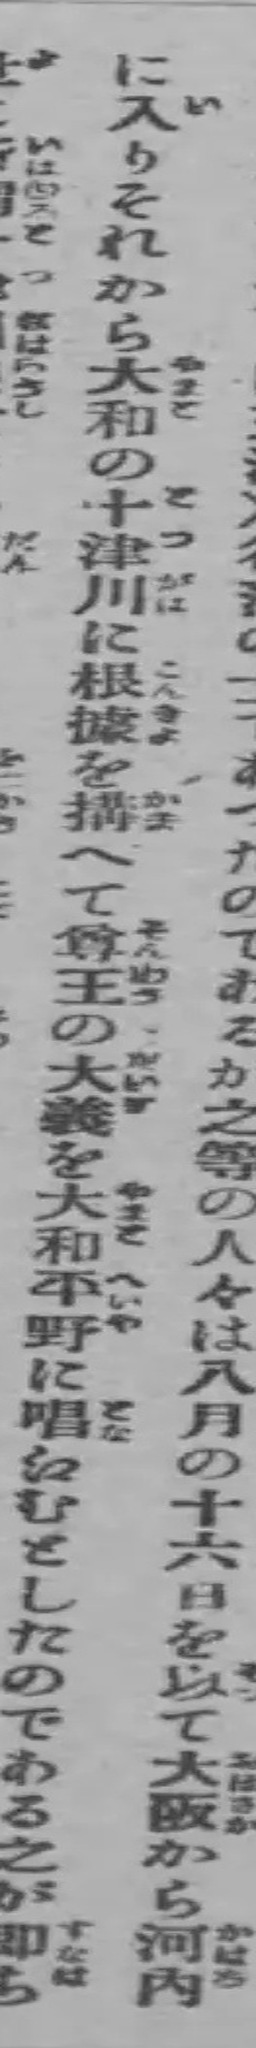に入りそれから大和の十津川に根拠を搆へて尊王の大義を大和平野に唱えむとしたのである之が即ち
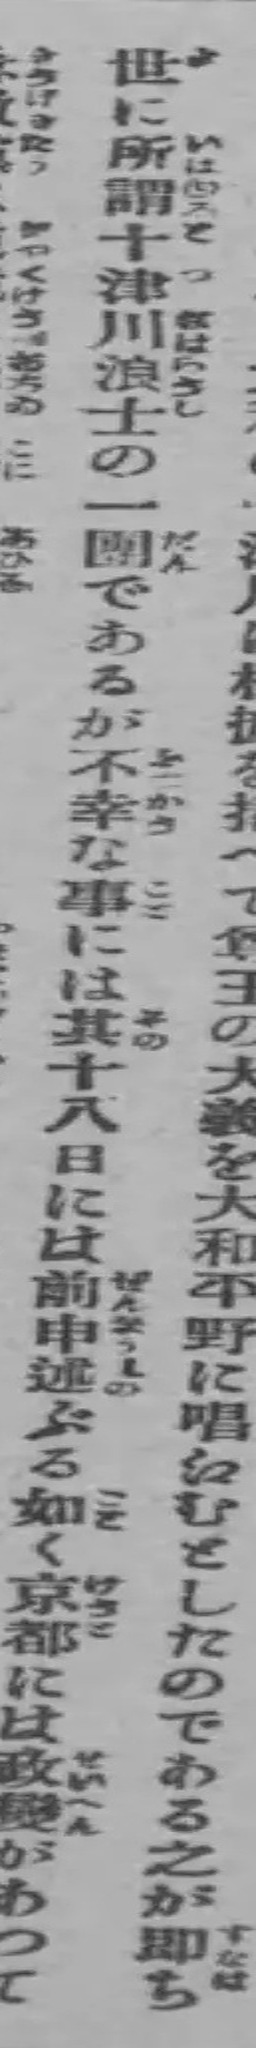世に所謂十津川浪士の一団であるが不幸な事には其十八日には前申述ぶる如く京都には政変があつて
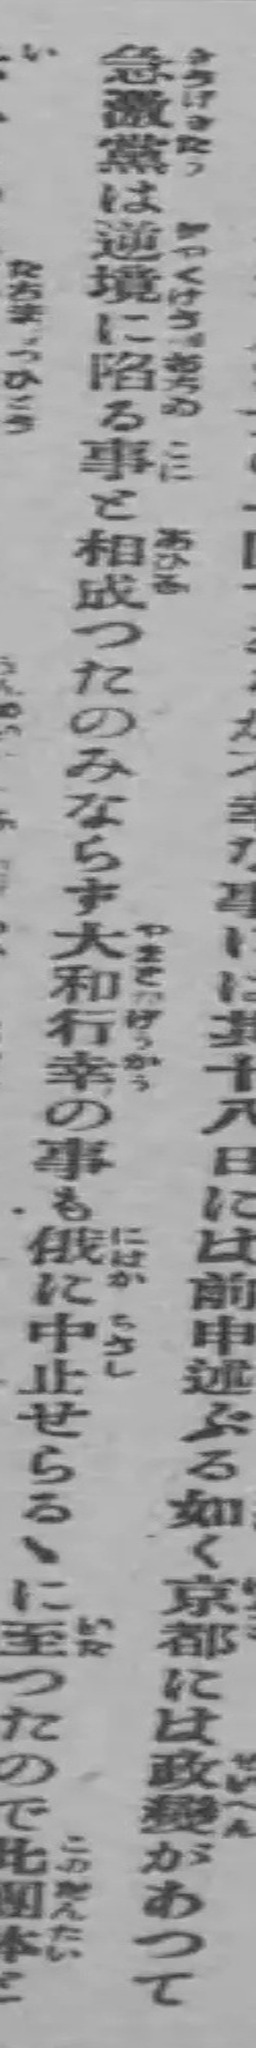急激党は逆境に陥る事と相成つたのみならず大和行幸の事も俄に中止せらるゝに至つたので此団体と
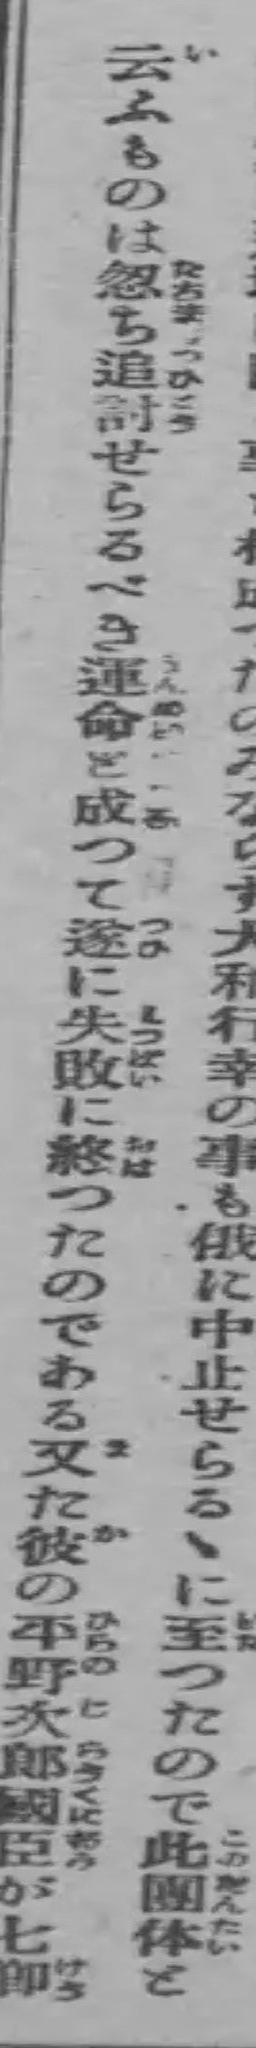云ふものは忽ち追討せらるべき運命と成つて遂に失敗に終つたのである又た彼の平野次郎国臣が七卿
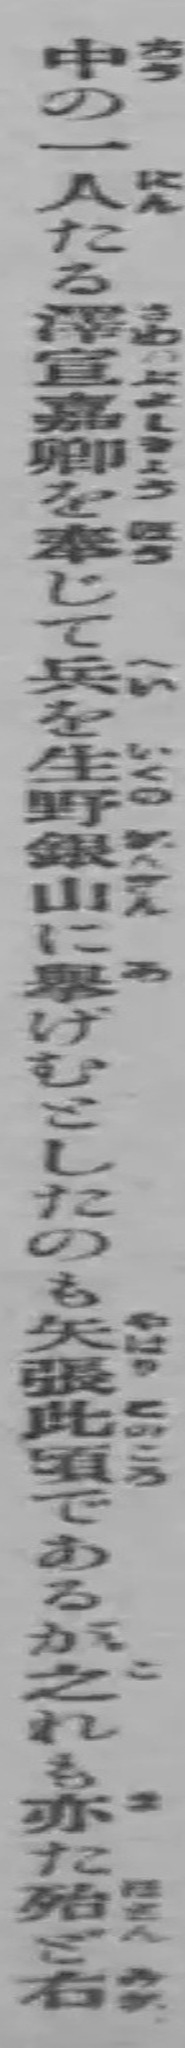生野の挙兵中の一人たる澤宣嘉卿を奉じて兵を生野銀山に挙げむとしたのも矢張此頃であるが之れも亦た殆ど右
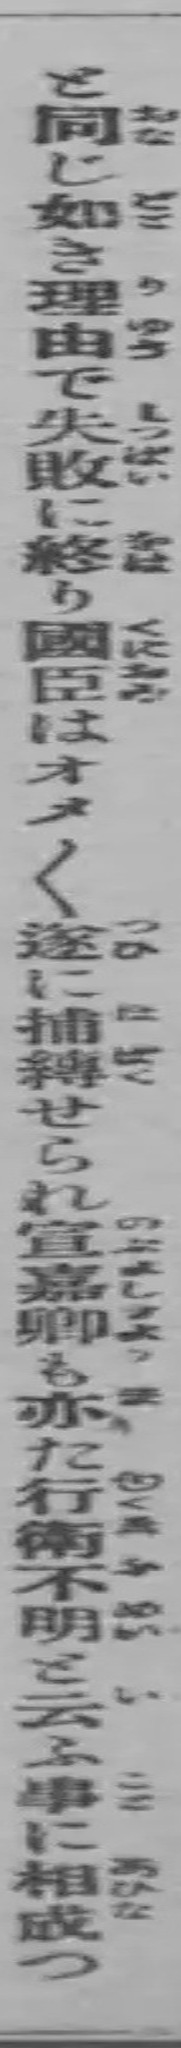と同じ如き理由で失敗に終り国臣はオメ〳〵遂に捕縛せられ宣嘉卿も亦た行衛不明と云ふ事に相成つ
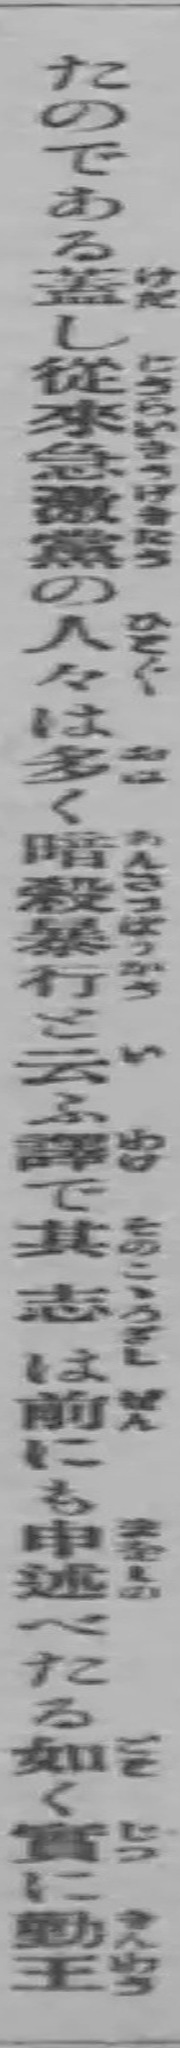たのである蓋し従来急激党の人々は多く暗殺暴行と云ふ訳で其志は前にも申述べたる如く実に勤王
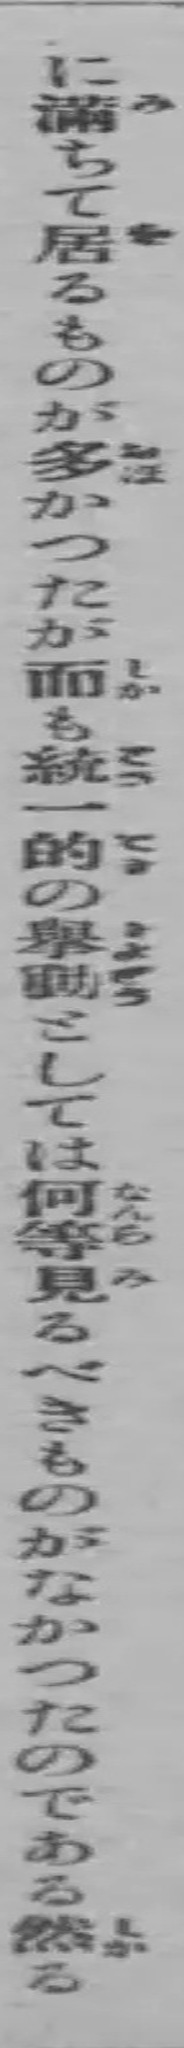に満ちて居るものが多かつたが而も統一的の挙動としては何等見るべきものがなかつたのである然る
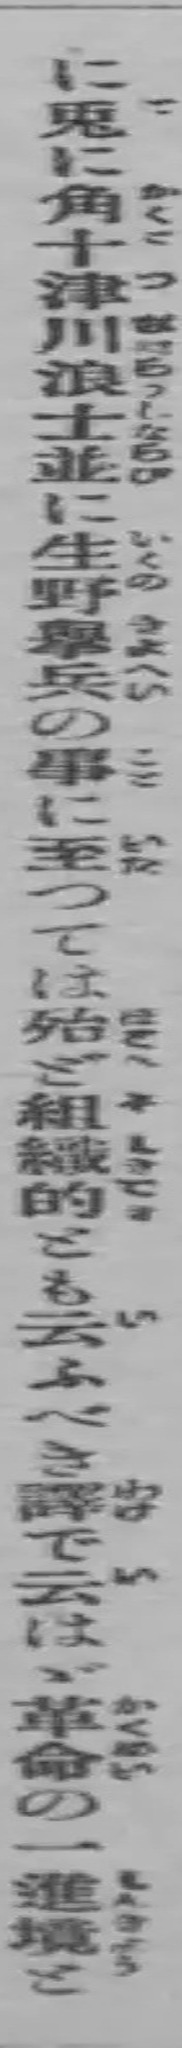に兎に角十津川浪士並に生野挙兵の事に至つては殆ど組織的とも云ふべき訳で云はゞ革命の一進境と
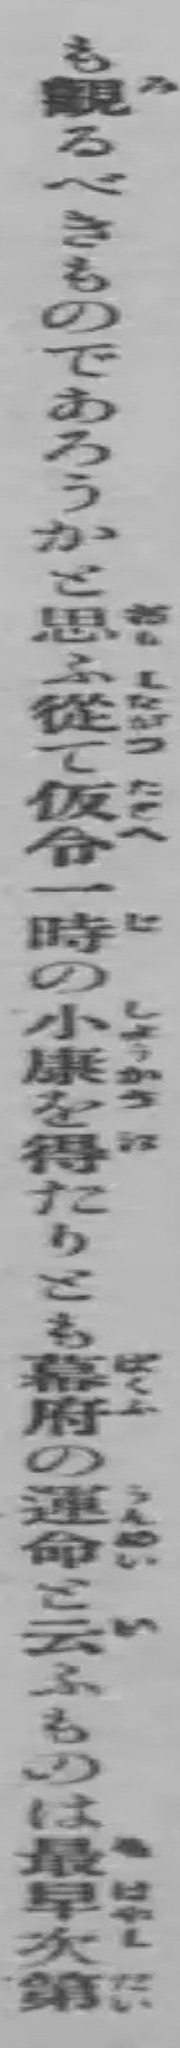も観るべきものであろうかと思ふ従て仮令一時の小康を得たりとも幕府の運命と云ふものは最早次第
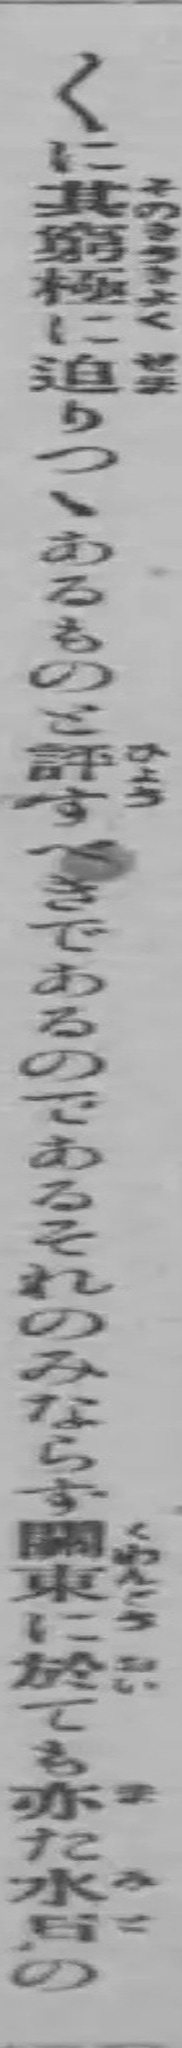〳〵に其窮極に迫りつゝあるものと評すべきであるのであるそれのみならず関東に於ても亦た水戸の
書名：豊橋市史談
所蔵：国立国会図書館 National Diet Library, JAPAN
